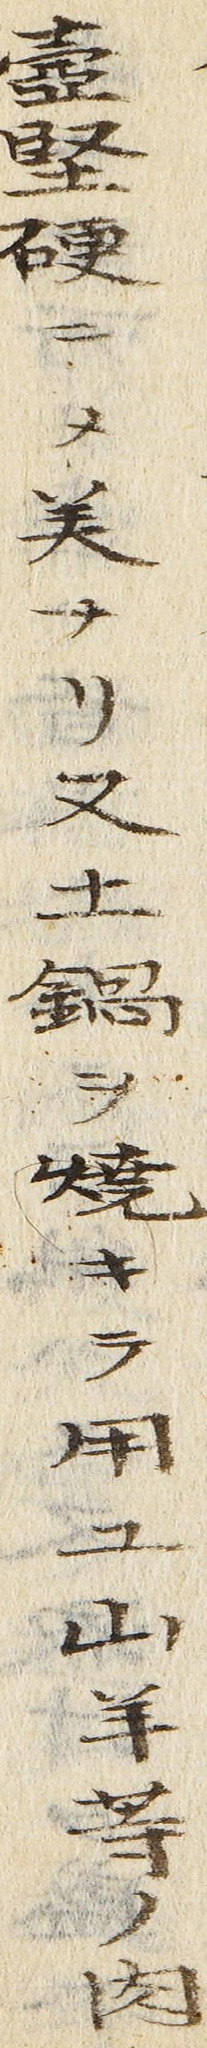壺堅硬ニシテ美ナリ又土鍋ヲ焼キテ用ユ山羊等ノ肉
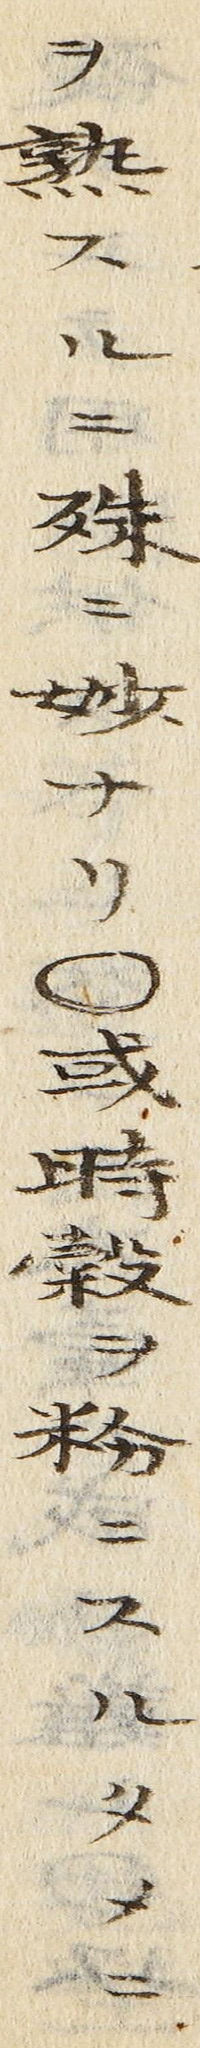ヲ熟スルニ殊ニ妙ナリ◯或時穀ヲ粉ニスルタメニ
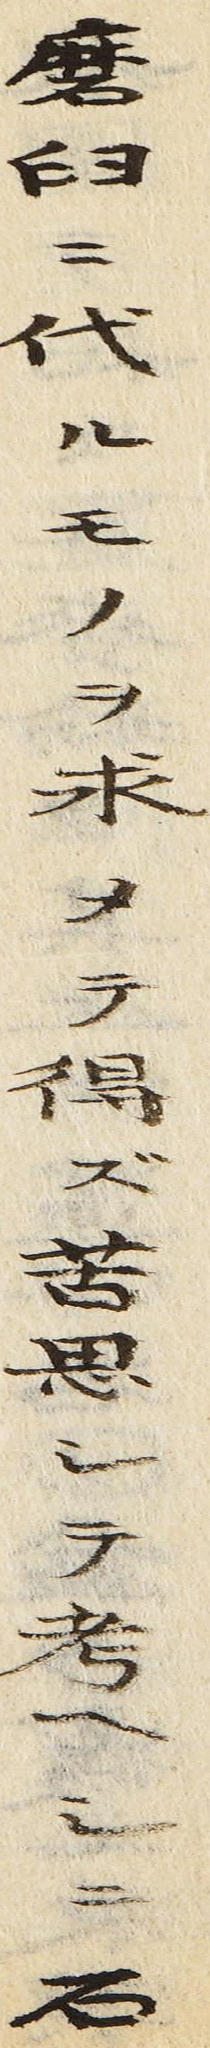磨臼ニ代ルモノヲ求メテ得ズ苦思シテ考ヘシニ石
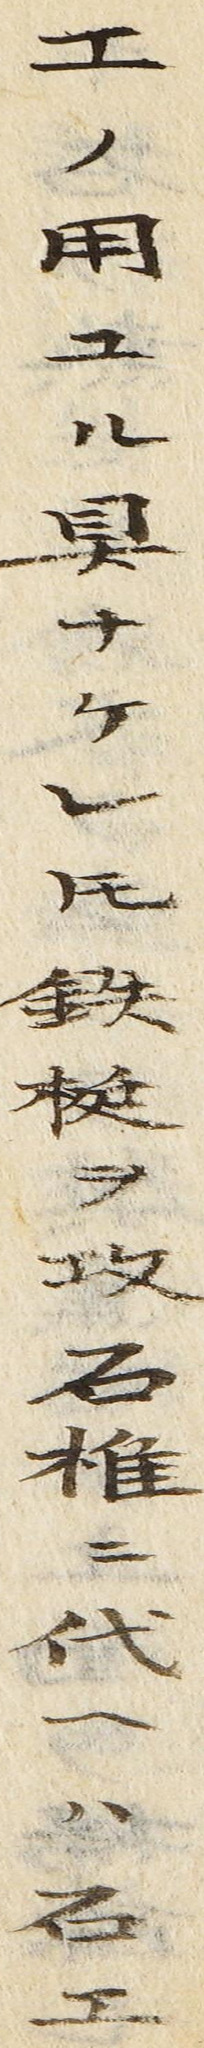工ノ用ユル具ナケレトモ鉄梃ヲ攻石椎ニ代ヘハ石工
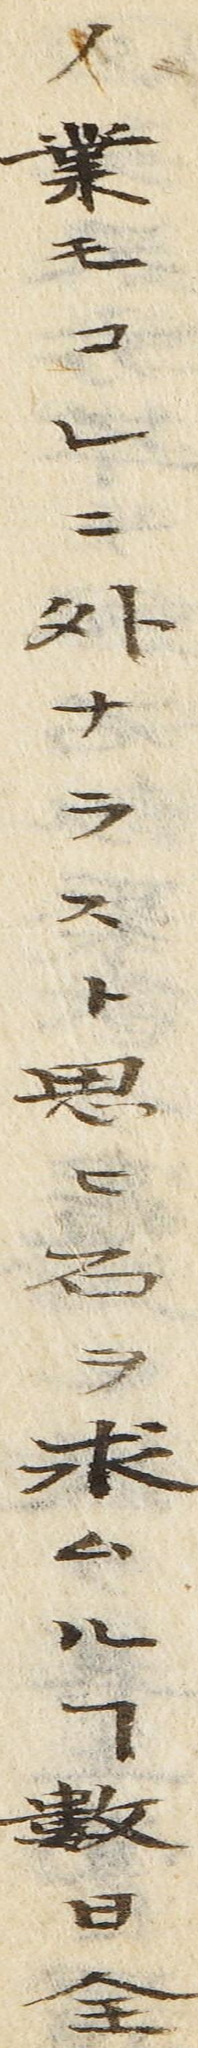ノ業モコレニ外ナラスト思ヒ石ヲ求ムルコト数日全
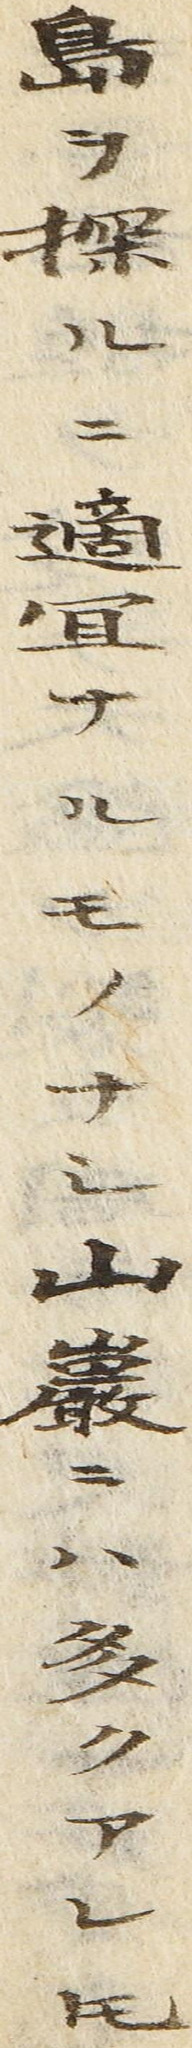島ヲ探ルニ適宜ナルモノナシ山巌ニハ多クアレトモ
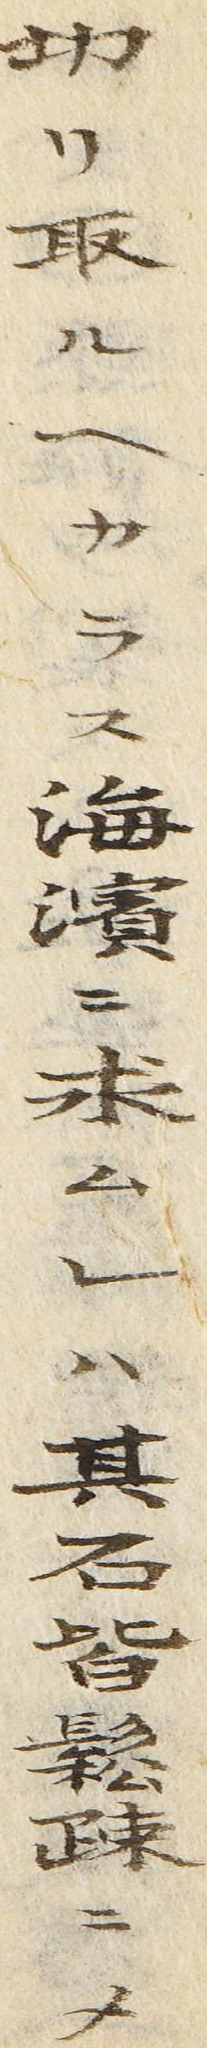切リ取ルヘカラス海浜ニ求ムレハ其石皆鬆疎ニシテ
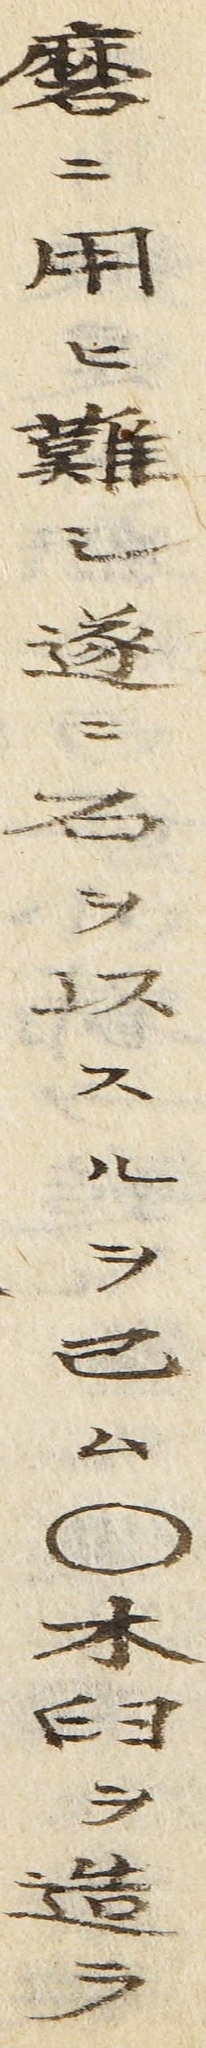磨ニ用ヒ難シ遂ニ石ヲ以スルヲ已ム◯木臼ヲ造ラ
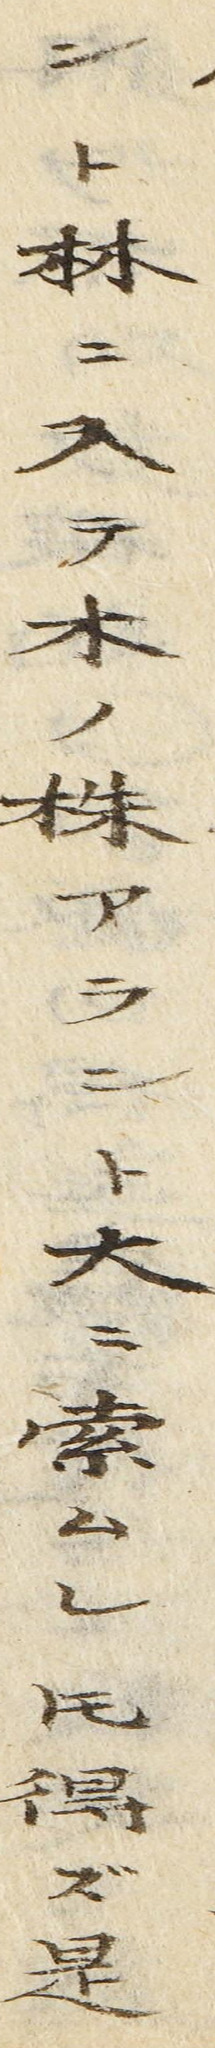ント林ニ入テ木ノ株アラント大ニ索ムレトモ得ズ是
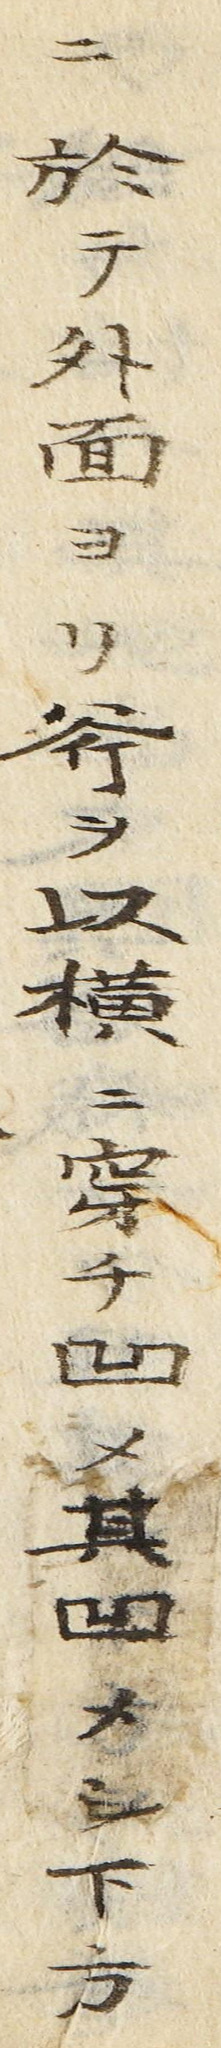ニ於テ外面ヨリ斧ヲ以横ニ穿チ凹メ其凹メシ下方
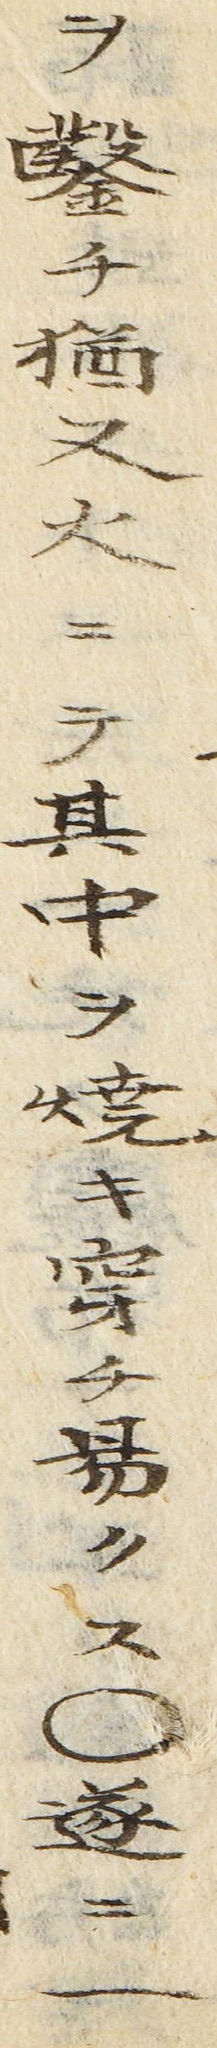ヲ鑿チ猶又火ニテ其中ヲ焼キ穿チ易クス◯遂ニ一
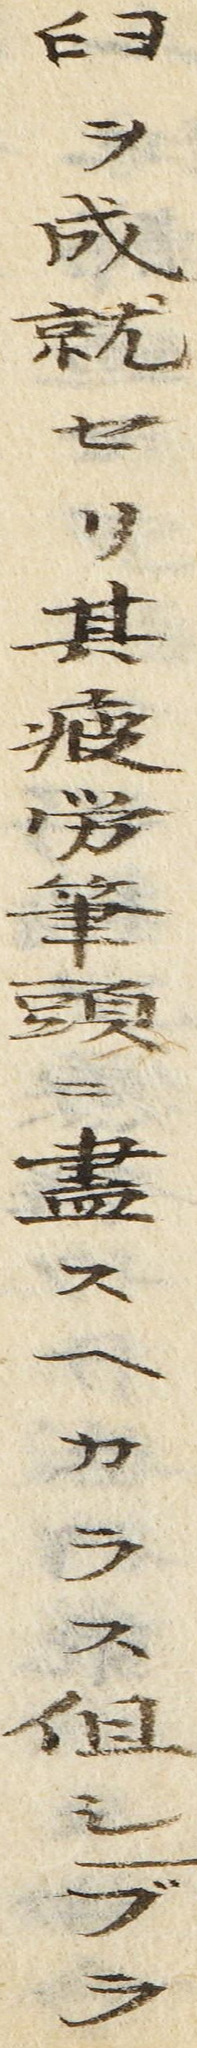臼ヲ成就セリ其疲労筆頭ニ尽スヘカラス但シ「ブラ
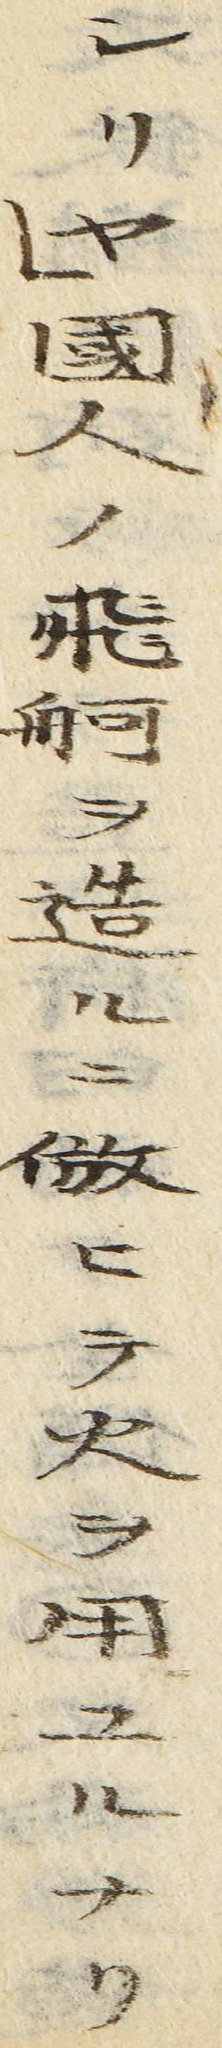シリヤ」国人ノ飛舸ヲ造ルニ倣ヒテ火ヲ用ユルナリ

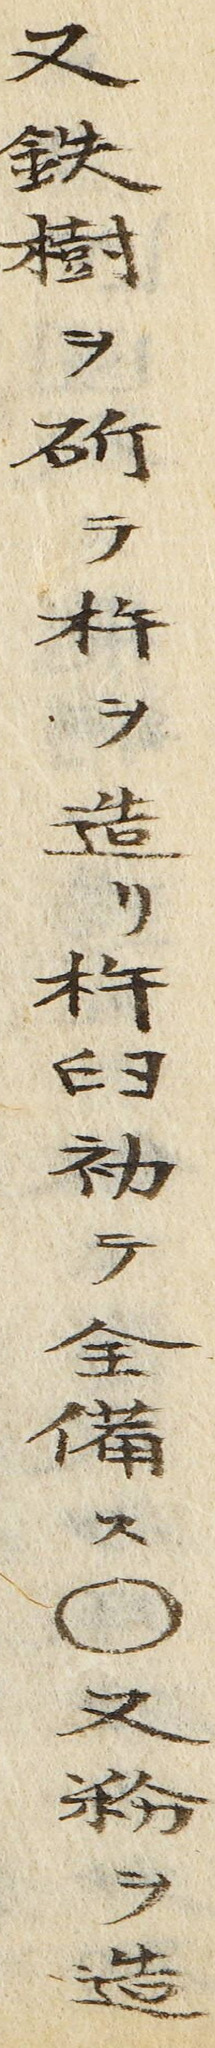又鉄樹ヲ斫テ杵ヲ造リ杵臼初テ全備ス◯又粉ヲ造
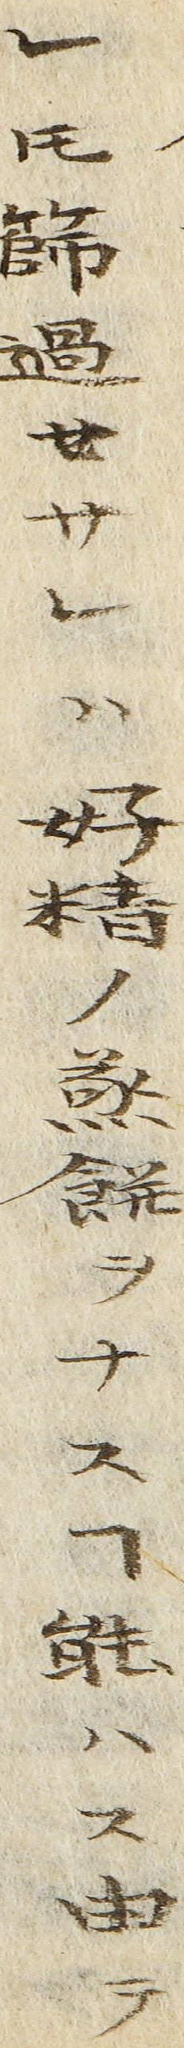レトモ篩過セサレハ好精ノ蒸餅ヲナスコト能ハス由テ
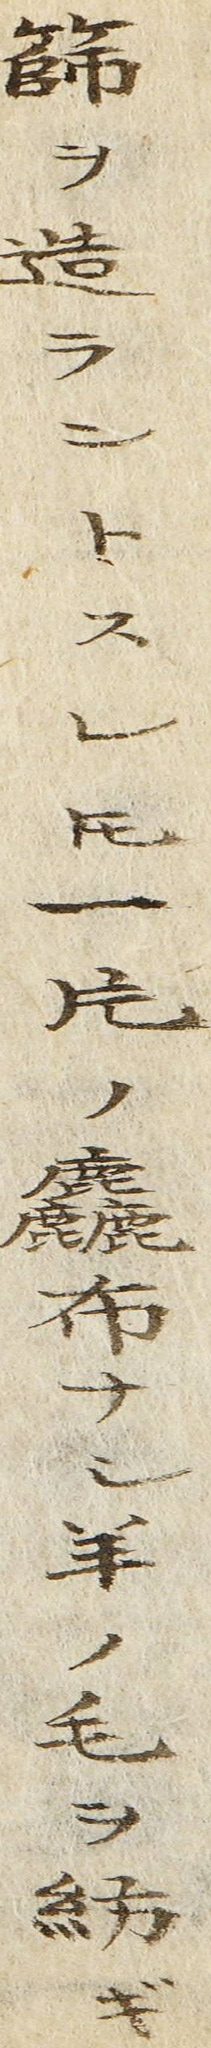篩ヲ造ラントスレトモ一片ノ麤布ナシ羊ノ毛ヲ紡ギ
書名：漂流紀事
